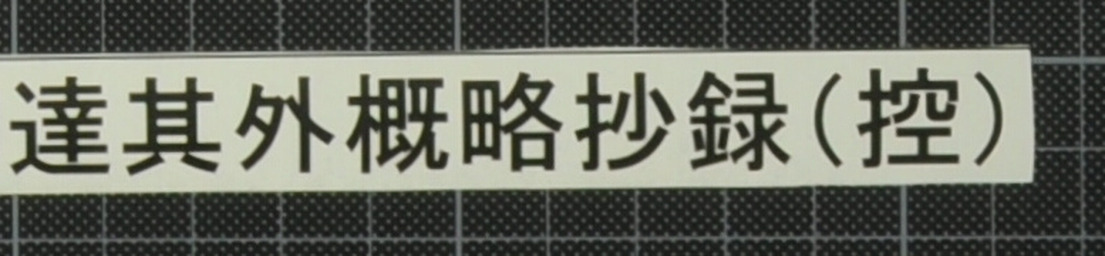甲府其外概略抄録
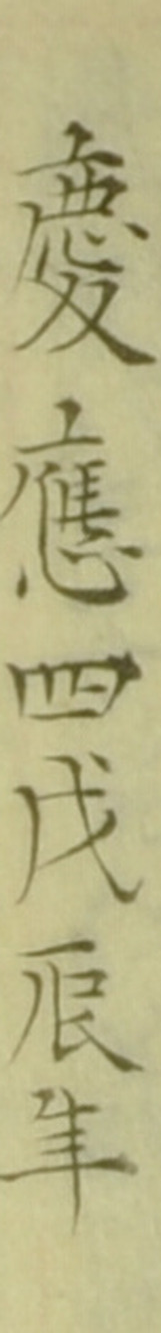慶應四戊辰年
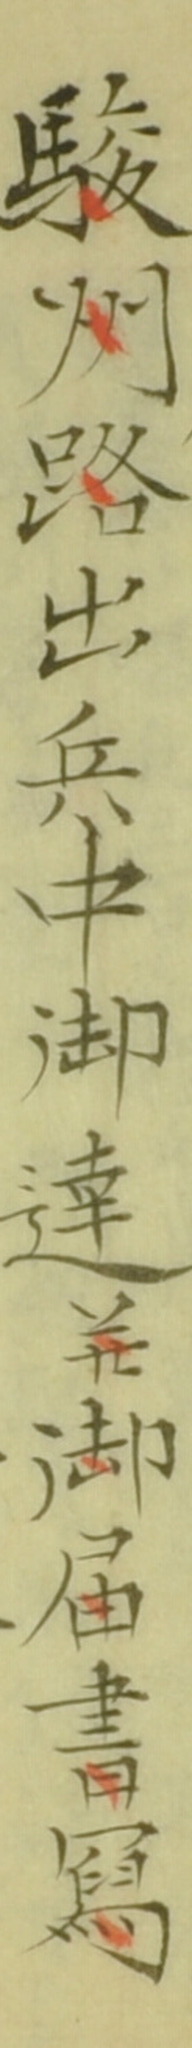駿州路出兵中御達并御届書写控

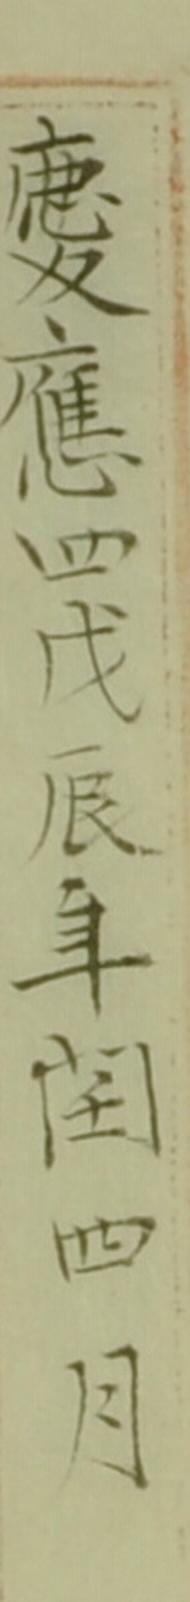慶應四戊辰年閏四月
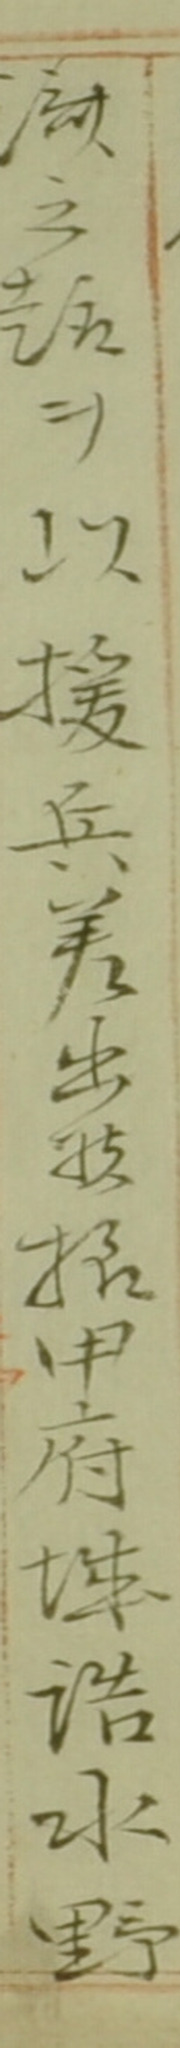済之趣ヲ以援兵差出候様甲府城詰水野
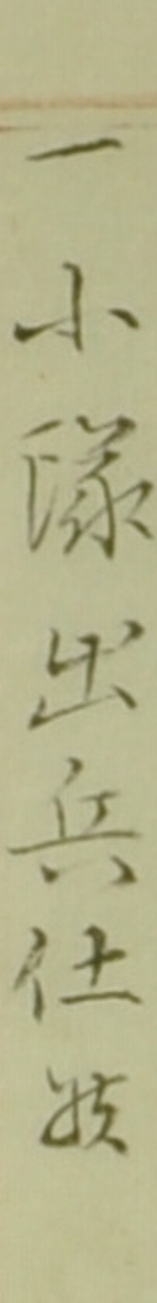一小隊出兵仕候
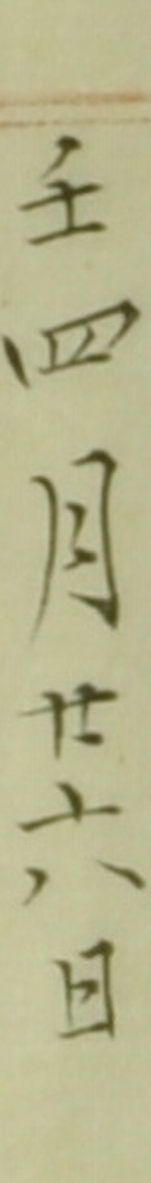壬四月廿六日

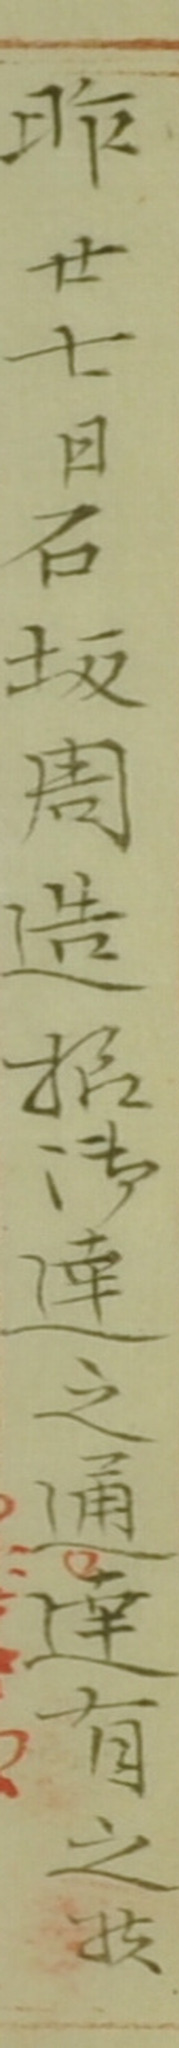昨廿七日石坂周造様御連之通達有之候
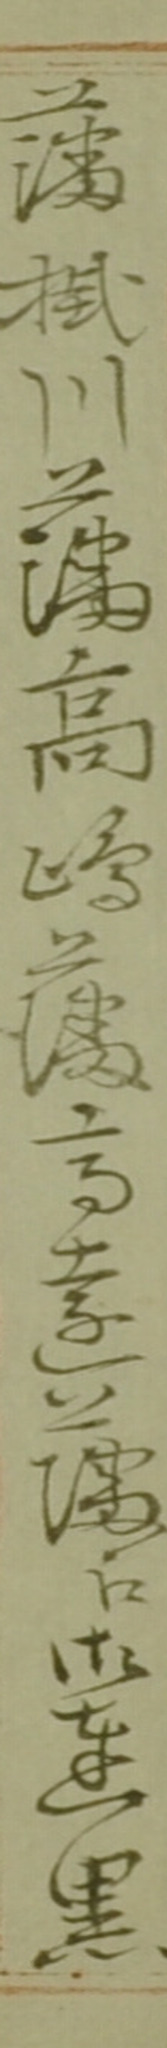藩掛川藩高嶋藩高遠藩江御黒
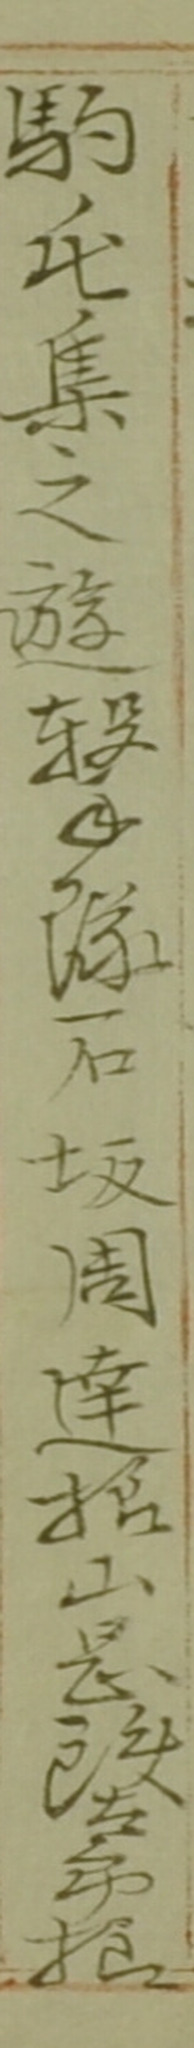駒屯集之遊撃隊石坂周達様山岡鉄太郎様
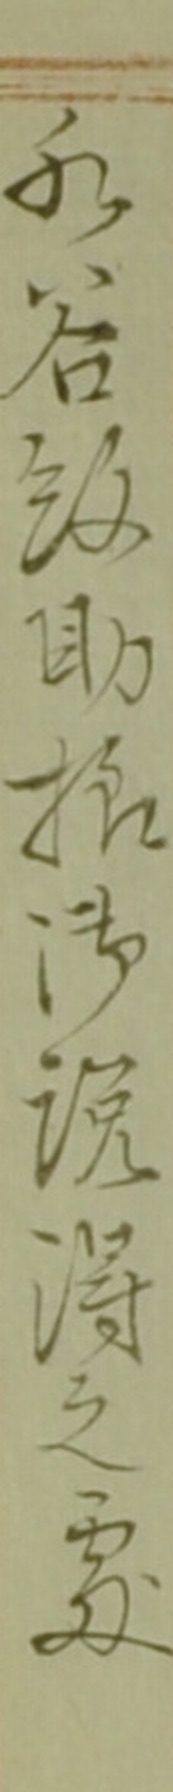水谷紋助様御説得之処
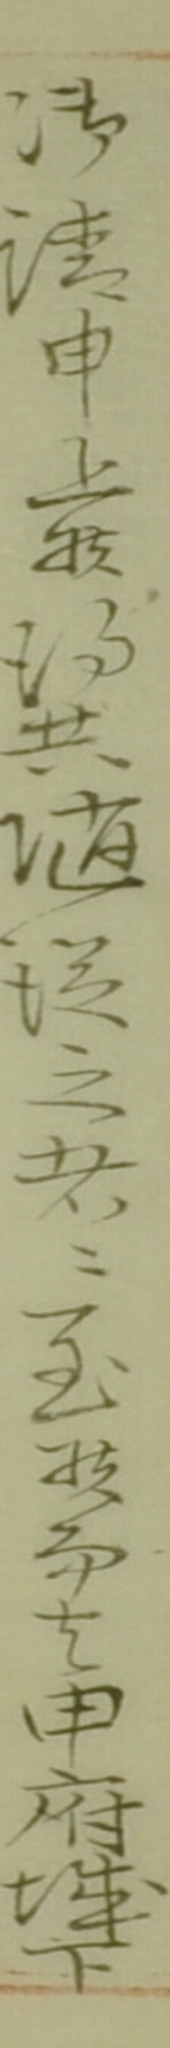御請申上候得共随従之者ニ至候而は甲府城下
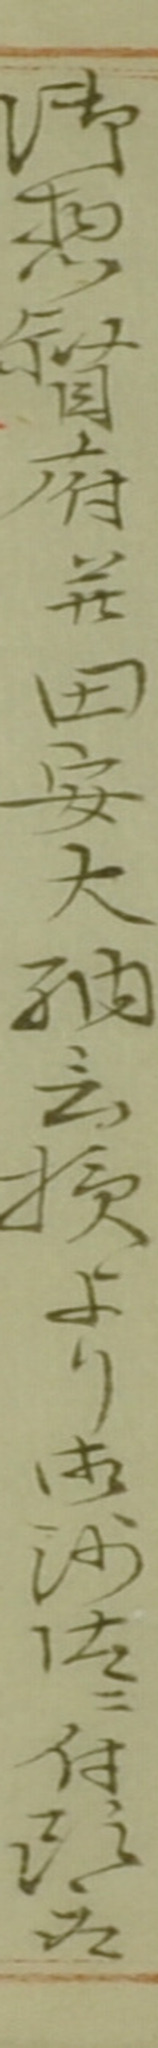御惣督府并田安大納言様より御沙汰ニ付頭取
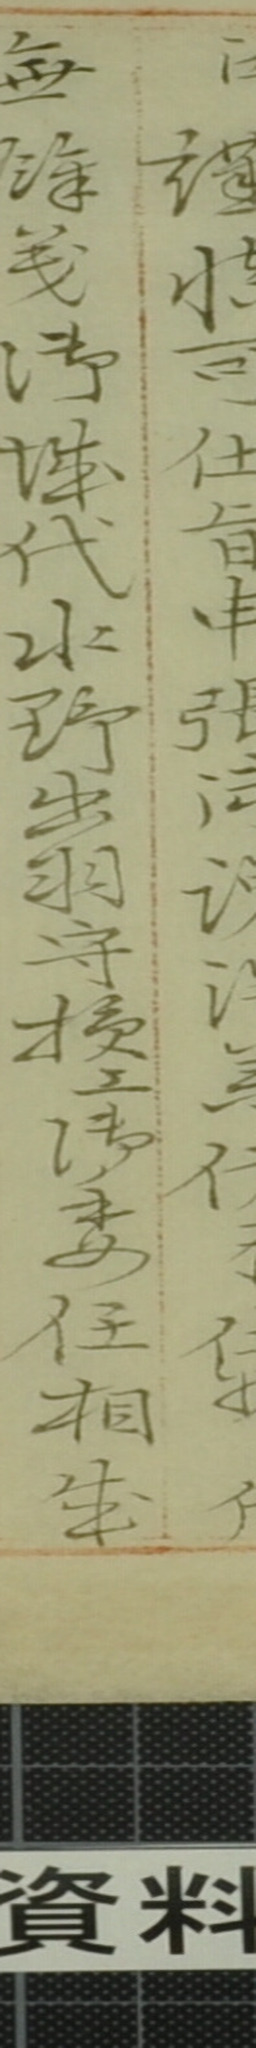無餘義御城代水野出羽守様上御委任相成
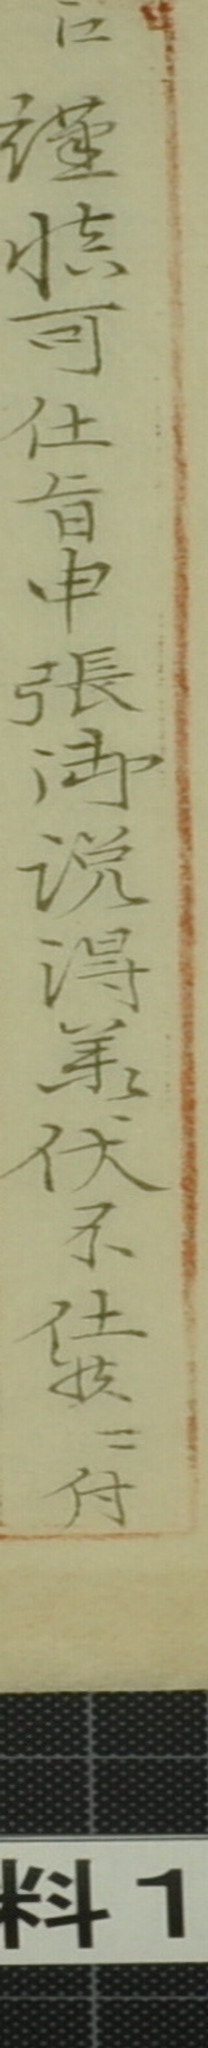得謹慎可仕旨申張御説得承伏不仕候ニ付
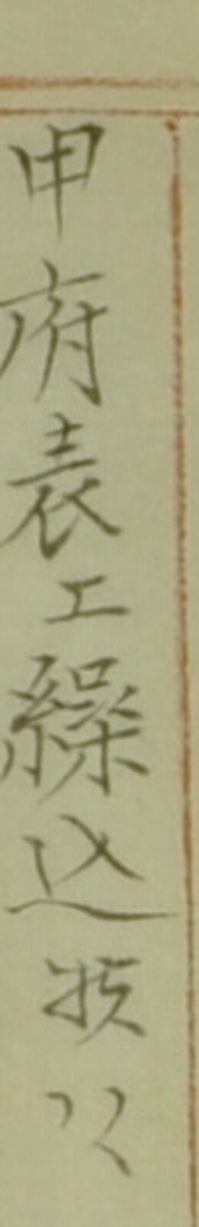甲府表エ繰込候以上
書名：甲府出兵中御達其外概略抄録（控）
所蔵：伊那市立高遠町図書館・合同会社AMANE
